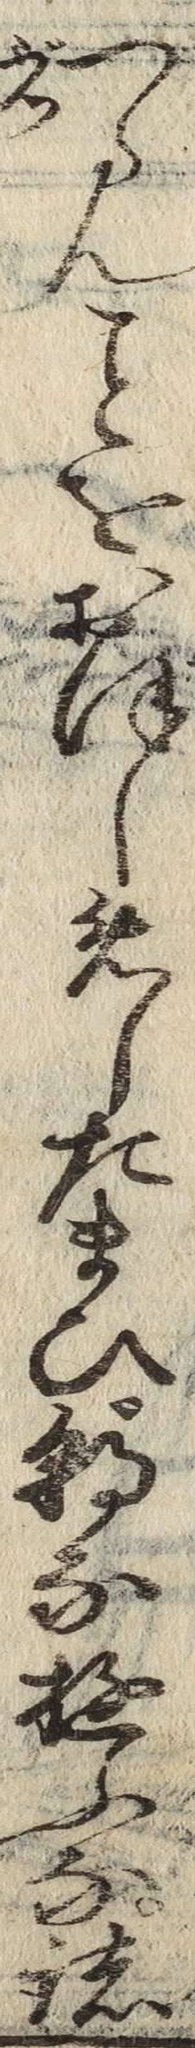つらんことをおぼしめしたまひ。朝なゆふな。諸
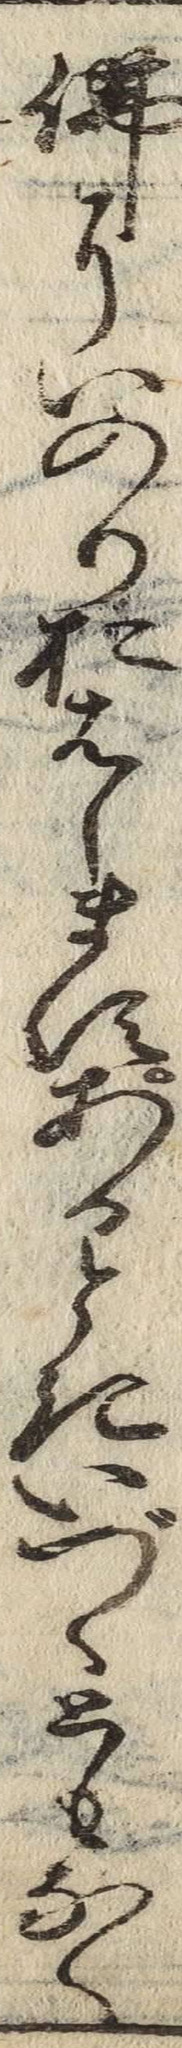仏にいのりおはします。あるときいづくともなく
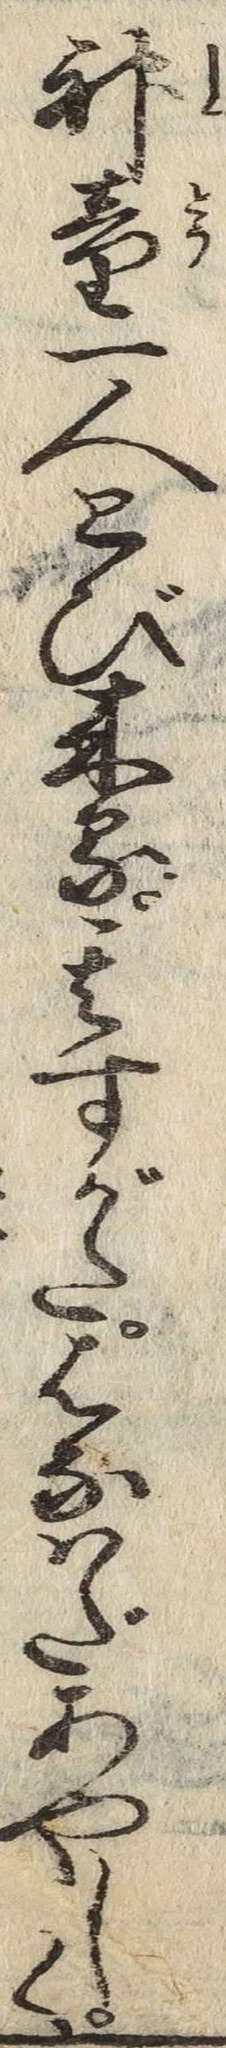神童一人とび来る。其すがた。はなはだあやしく。
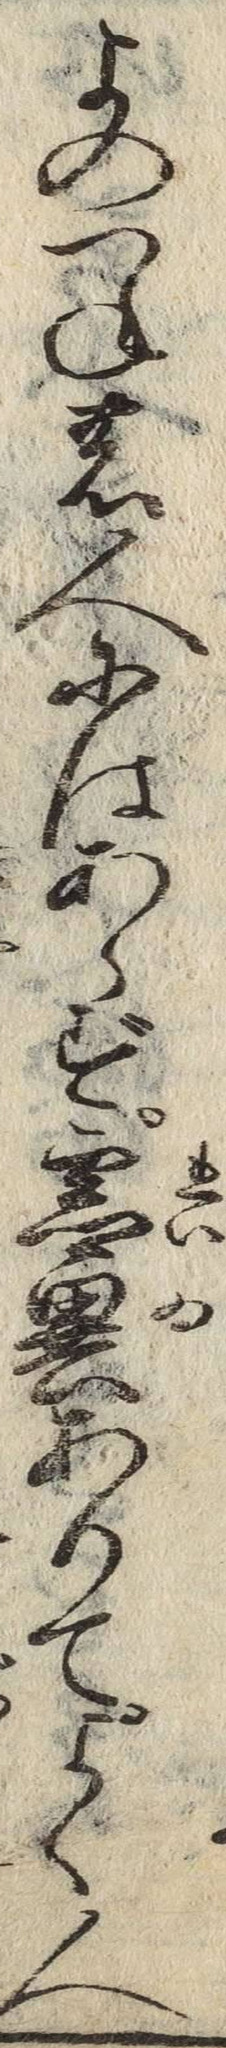よのつねの人にはあらず。霊異ありて。よく人
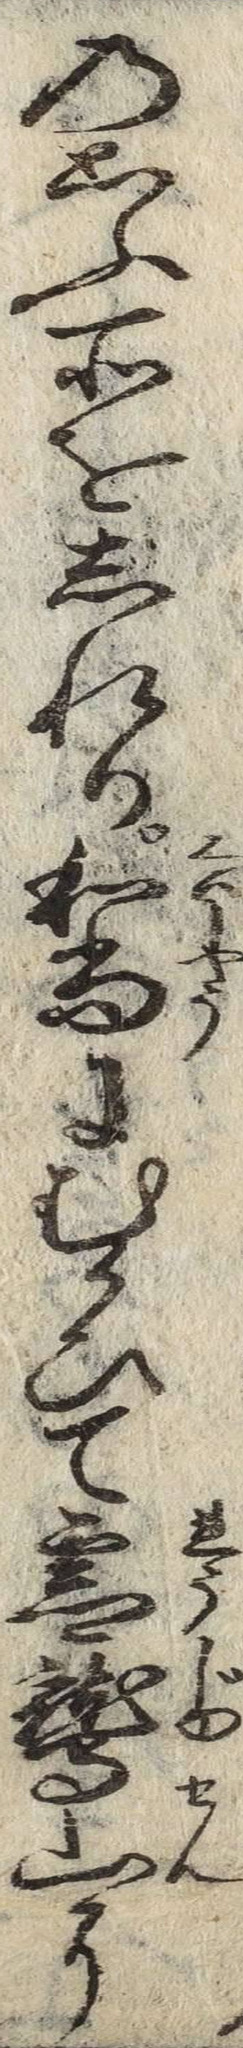の思ふ所をしれり。和尚にむかひて霊鷲山に
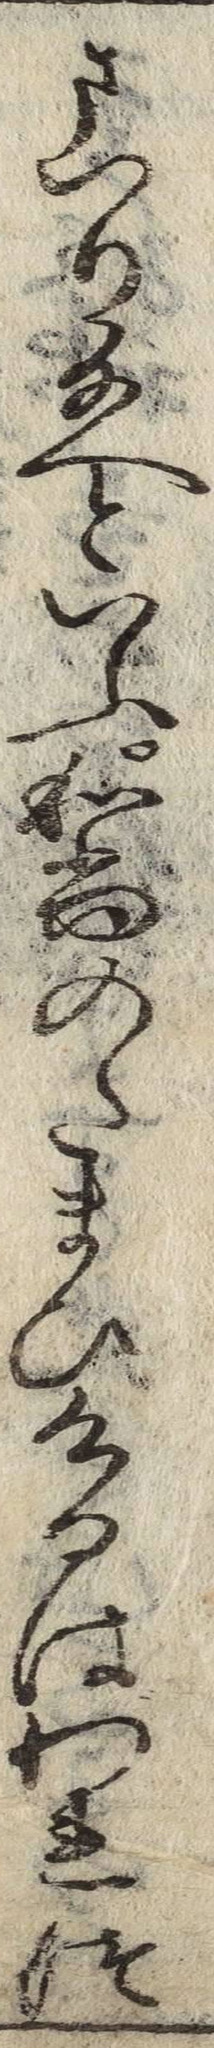まいり給へといふ。和尚のたまひけるはわれつ
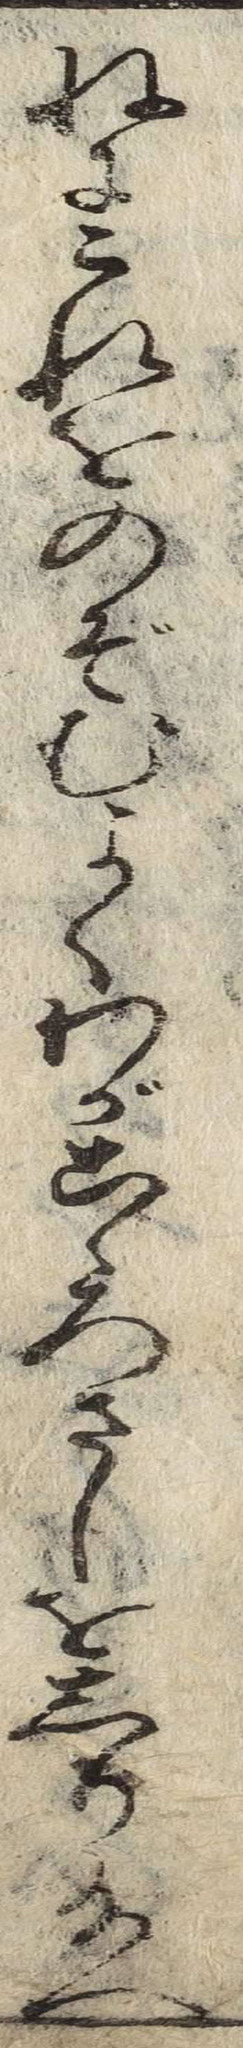ねにこれをのぞむよくわがこゝろさしを知り給へ
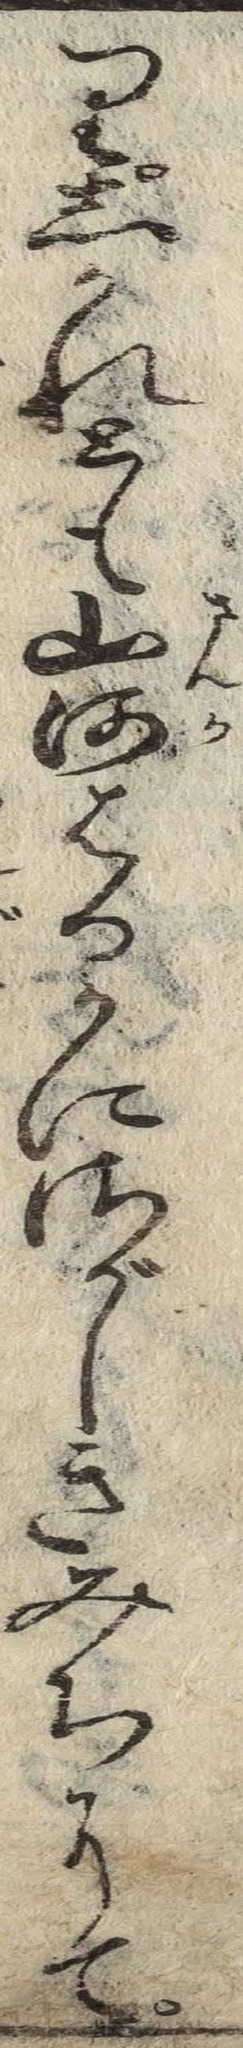り。しかれとも山河はるかにさがしきみちにて。
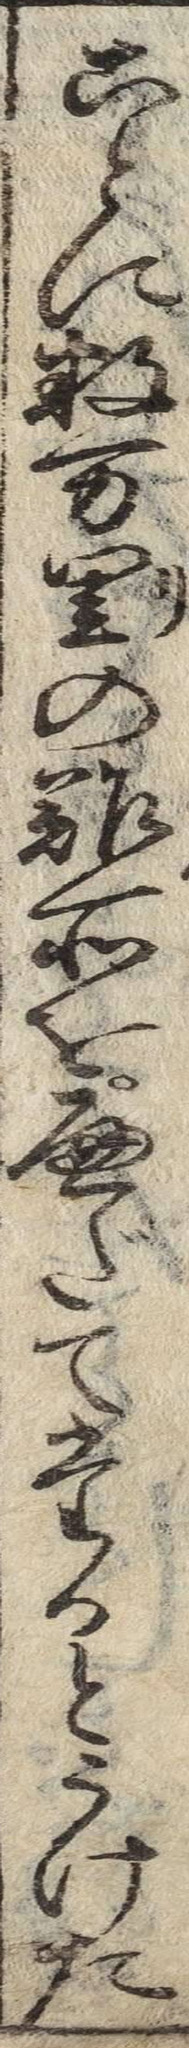ことに数万里の難所を。へだてたるとうけた

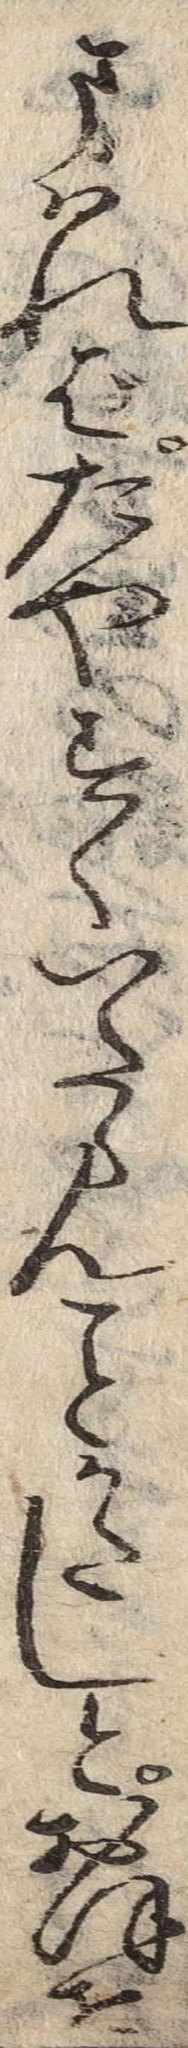まはれば。たやすくいたらんことかたしと。おほせ
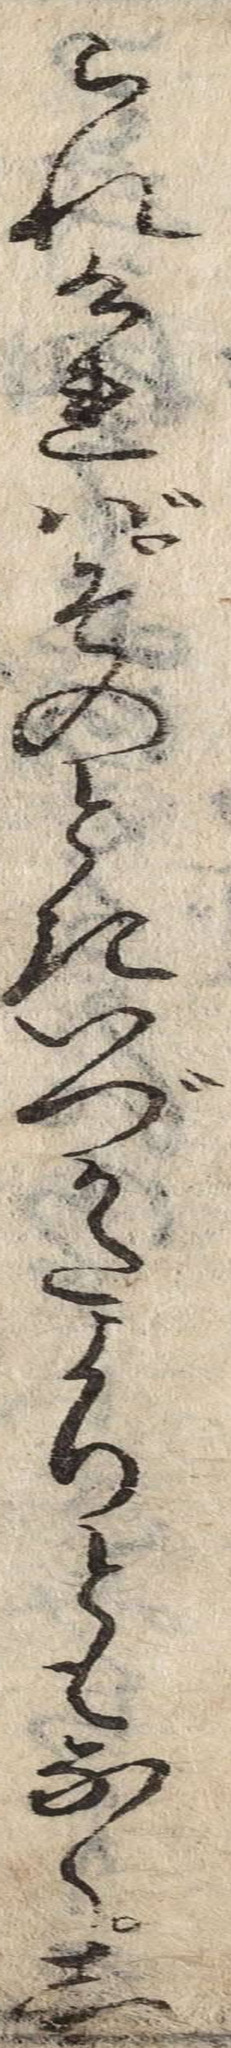られければ。そのときいづかたよりともなく。し
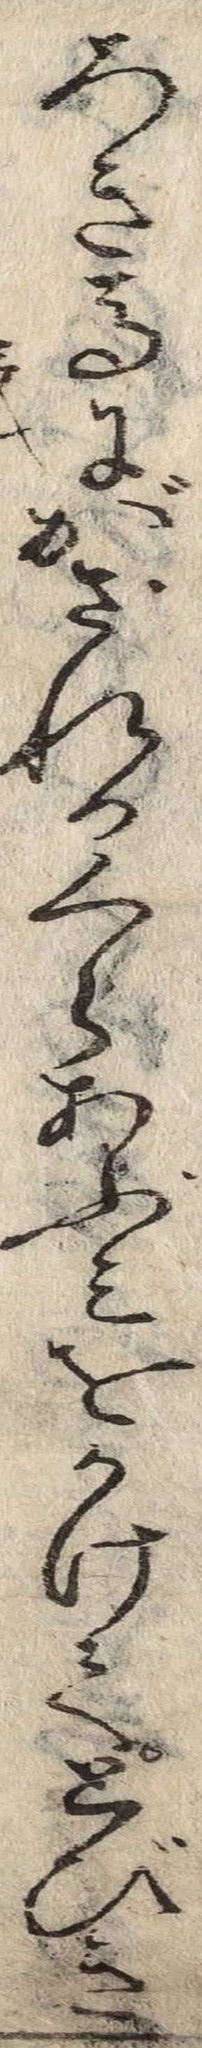ろき馬にかざれるくらあふみをかけて。とびき
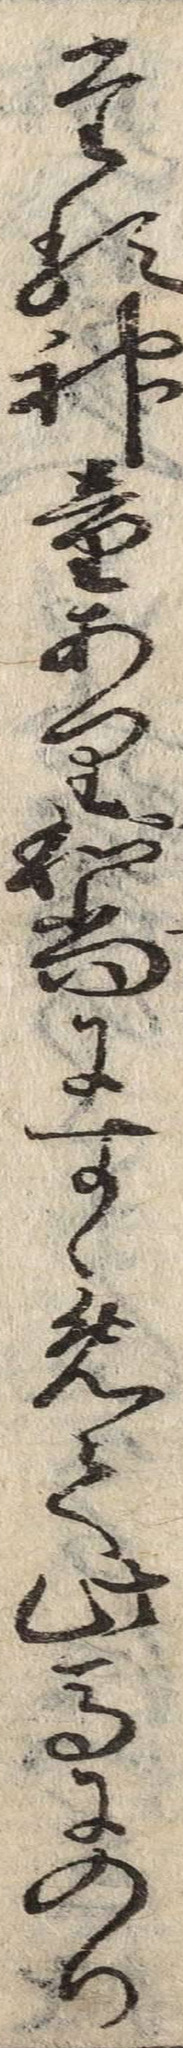たる神童あり。和尚にすゝめて此馬にのり
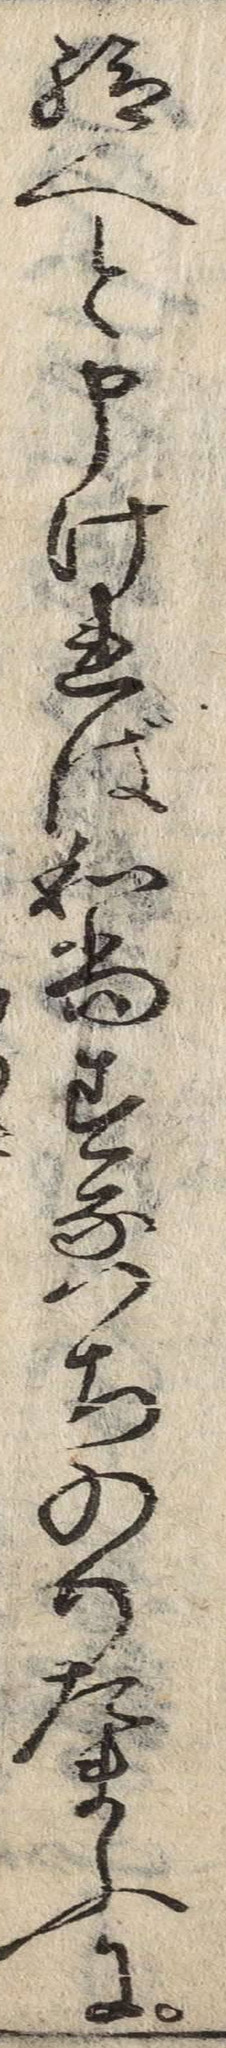給へと申けれは和尚すなはちのりたまふに。
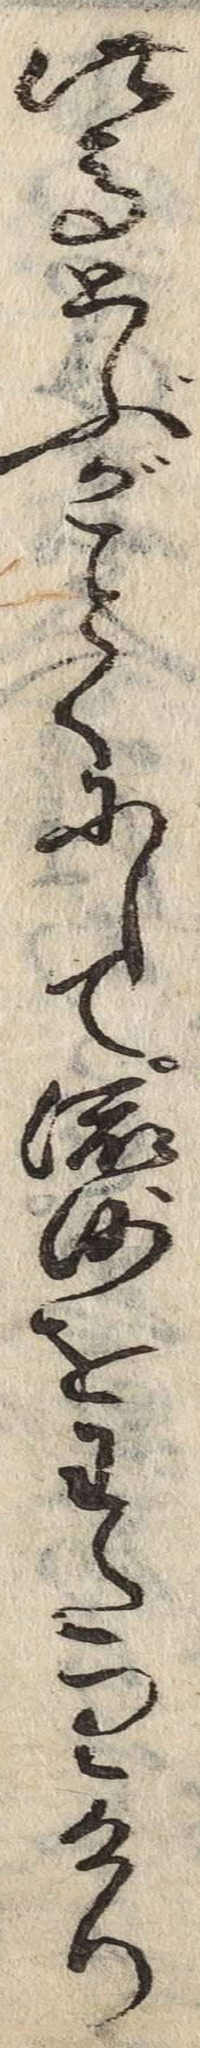此馬とぶがことくにして。流砂をわたりけり。

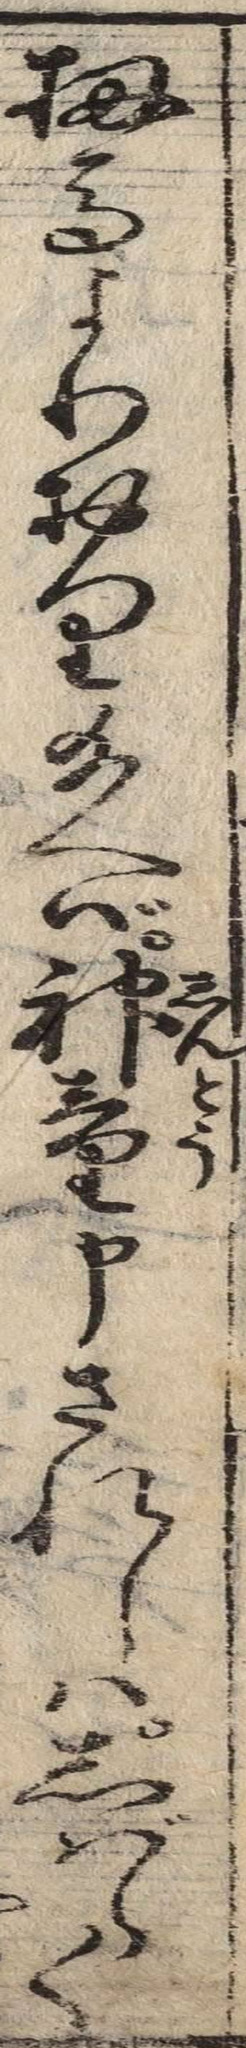扨馬よりおり給へば。神童申されしは。しばらく
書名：弘法大師御傳記
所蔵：京都府立京都学・歴彩館 国文学研究資料館
